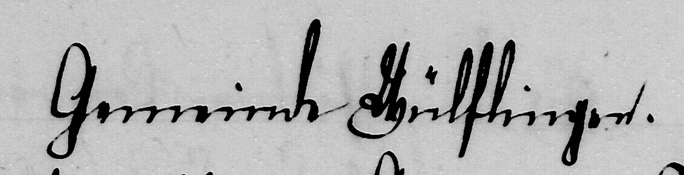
Gemeinde Wülflingen.
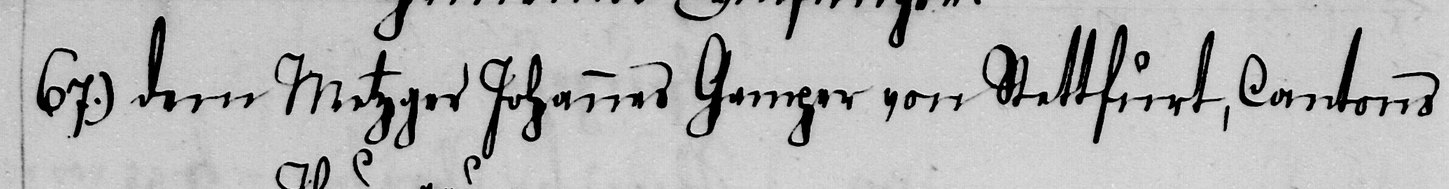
67.) dem Metzger Johannes Gamper von Stettfurt, Cantons
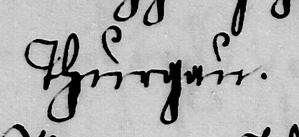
Thurgau.
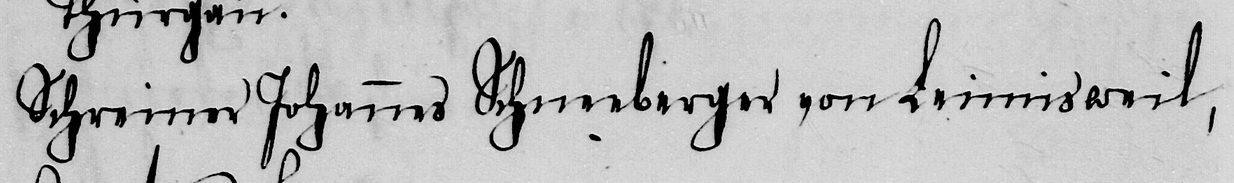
Schreiner Johannes Schneeberger von Leimisweil,
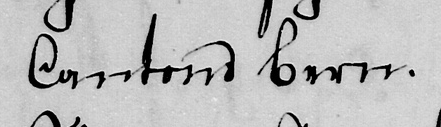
Cantons Bern.
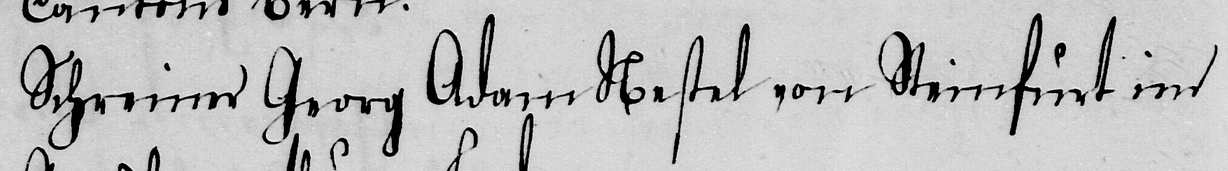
Schreiner Georg Adam Nestel von Steinfurt im
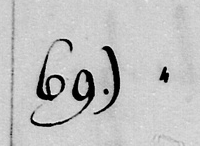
69.)
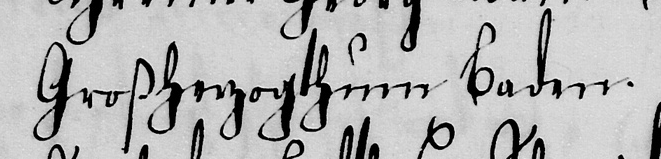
Großherzogthum Baden.
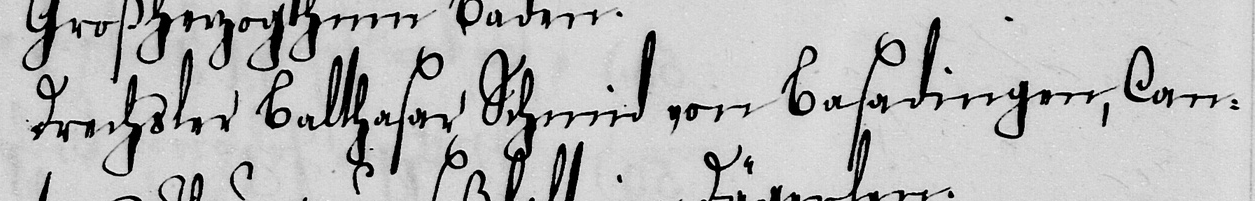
Drechsler Balthasar Schmid von Basadingen, Can¬
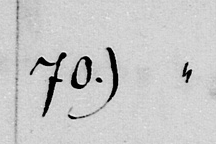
70.)
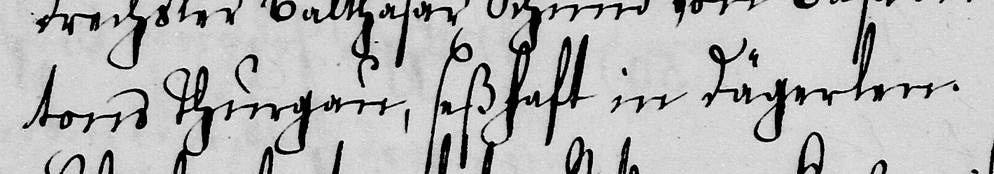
tons Thurgau, seßhaft in Dägerlen.
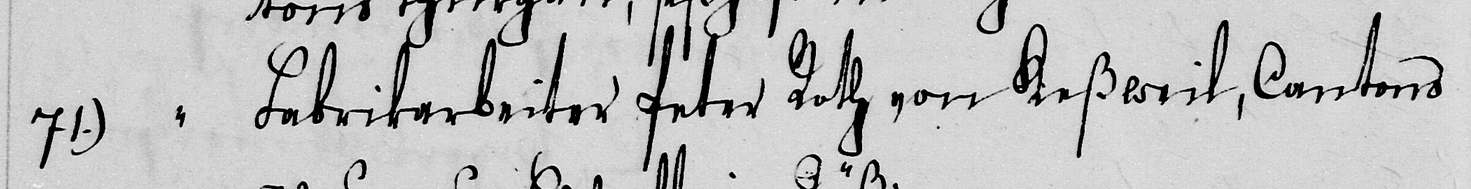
71.) “ Fabrikarbeiter Peter Roth von Keßweil, Cantons
